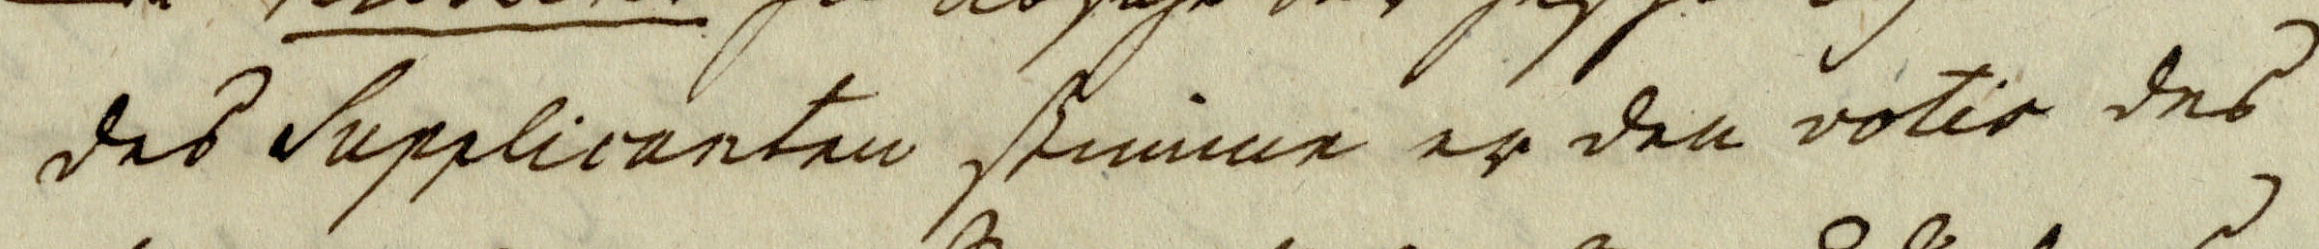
des Supplicanten stimme er den votis des
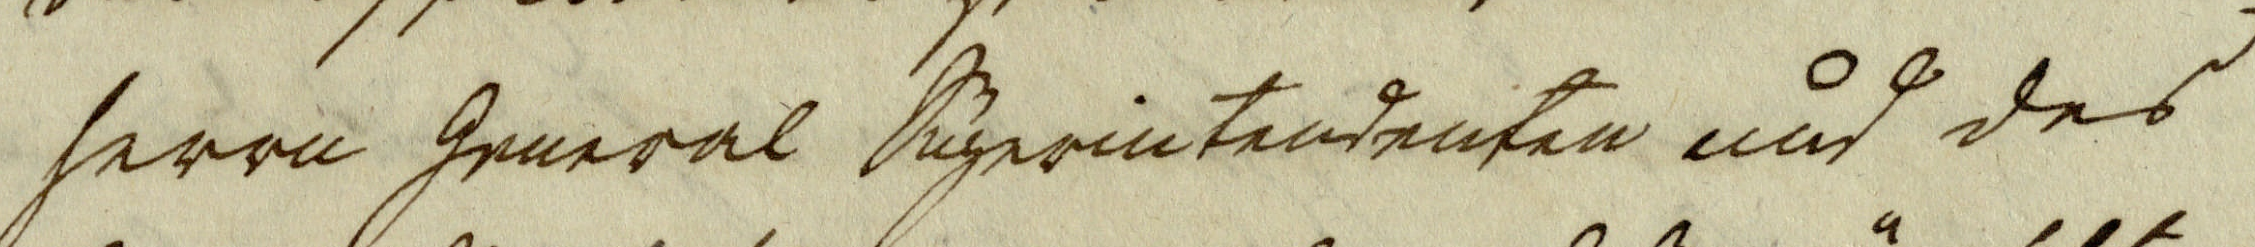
Herrn General Superintendenten und des
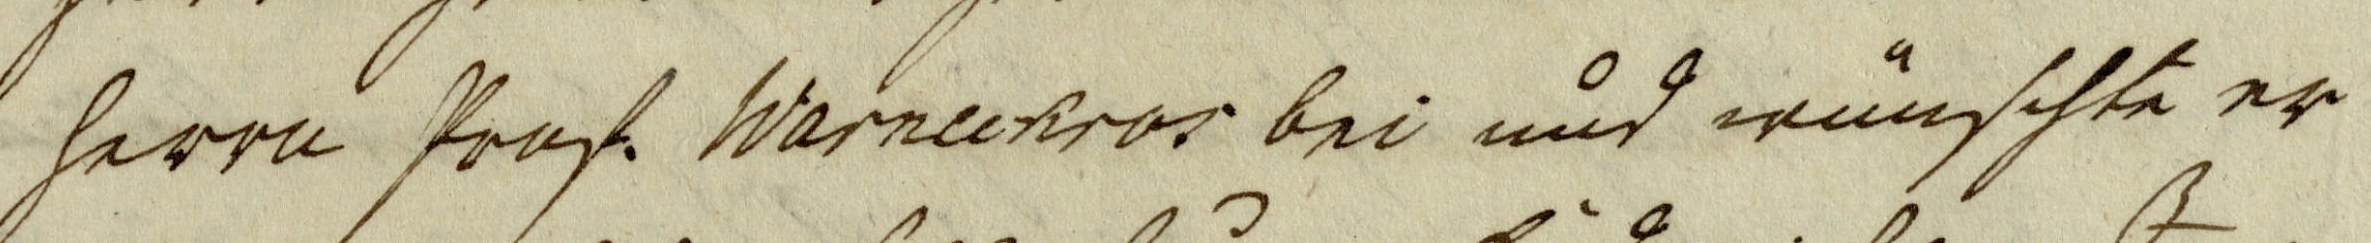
Herrn Prof. Warneckros bei und wünschte er
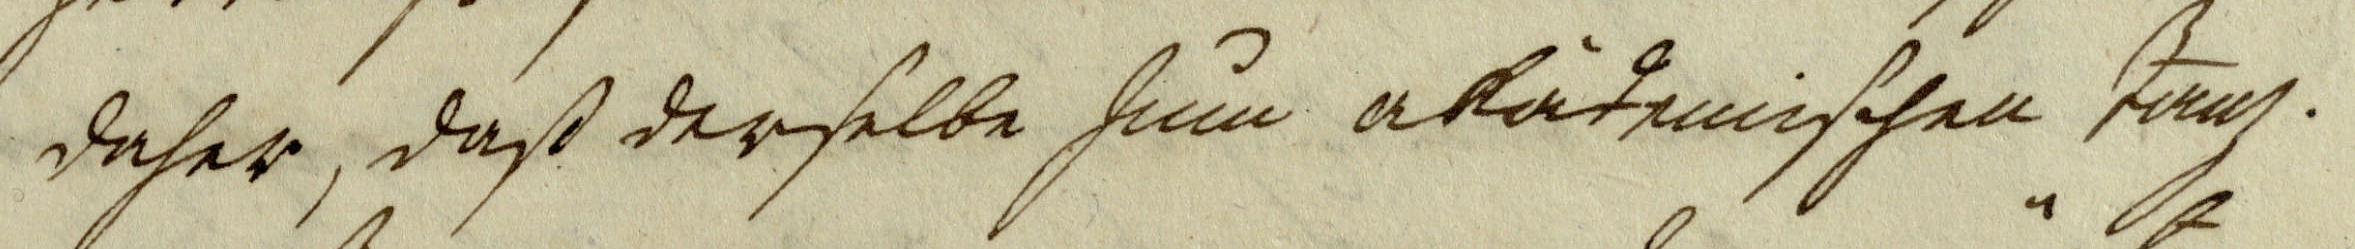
daher, daß derselbe zum akademischen Tanz¬
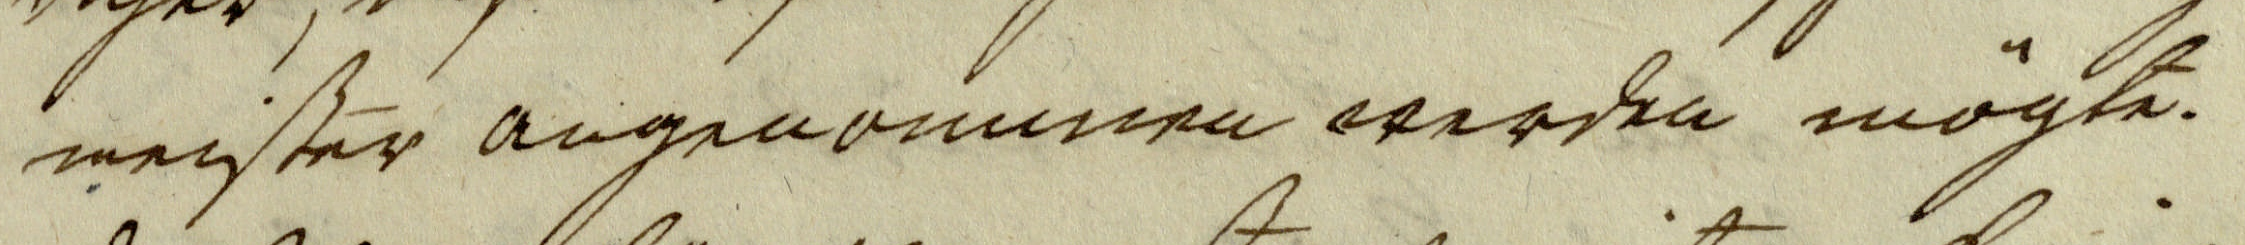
meister angenommen werden mögte.
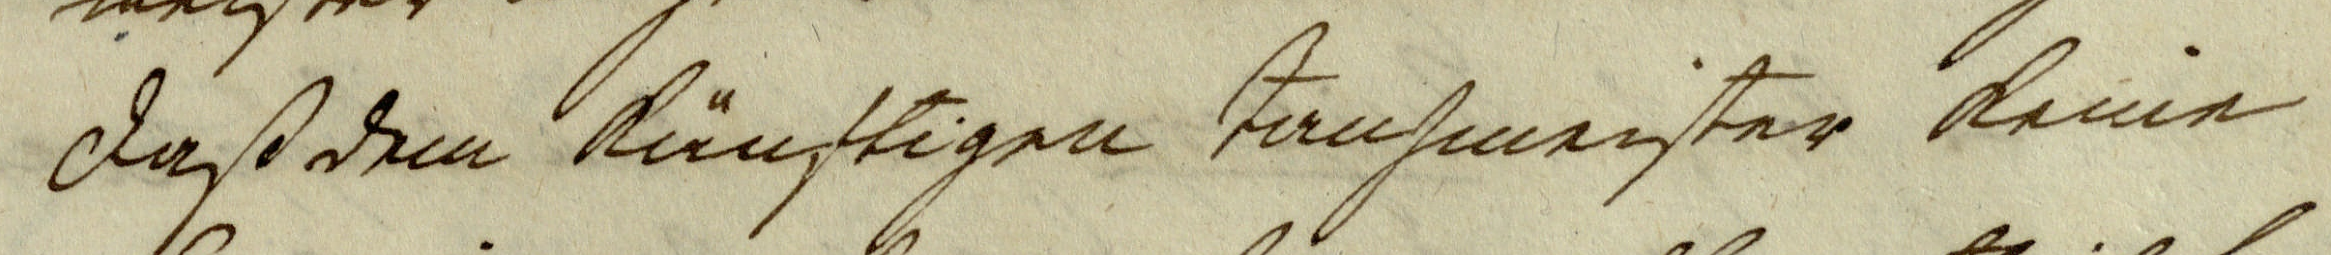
Daß dem künftigen Tanzmeister keine
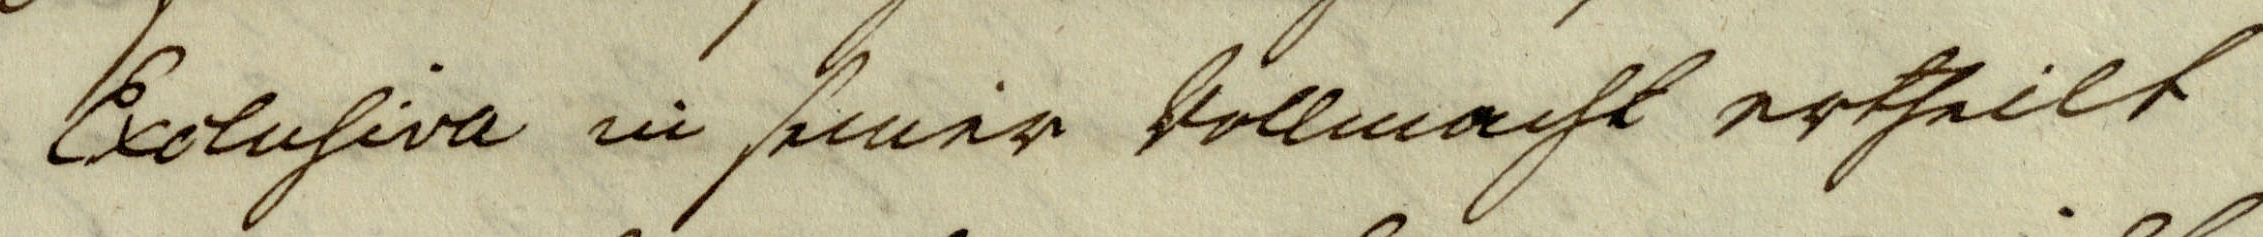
Exclusiva in seiner Vollmacht ertheilt
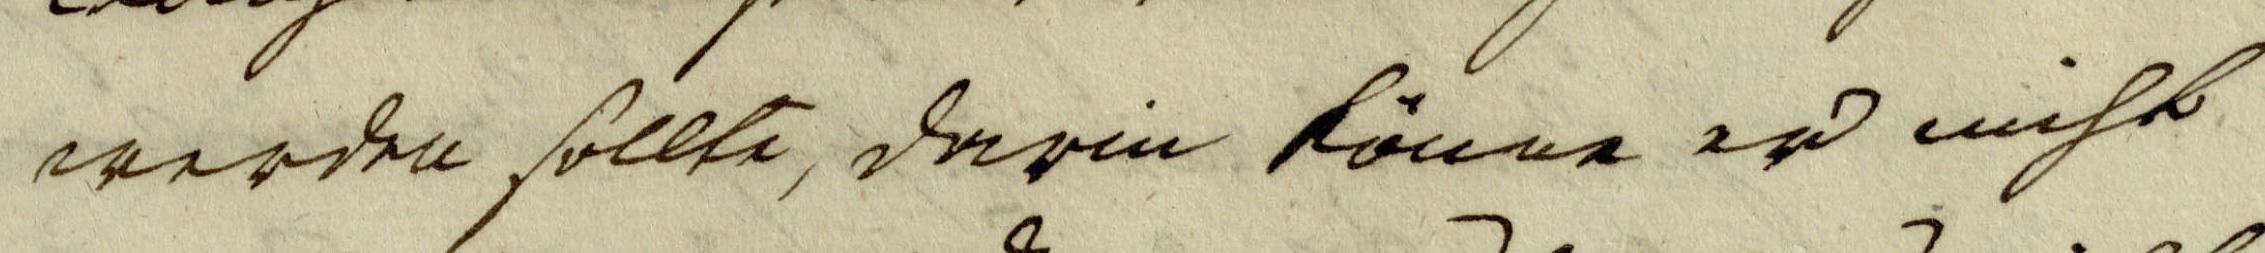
werden sollte, darin könne er nicht
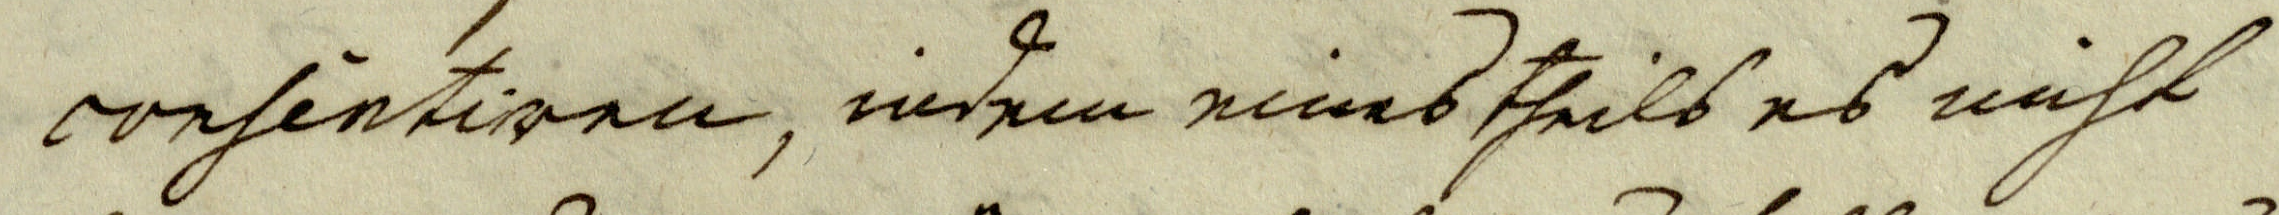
consentiren, indem eines theils es nicht
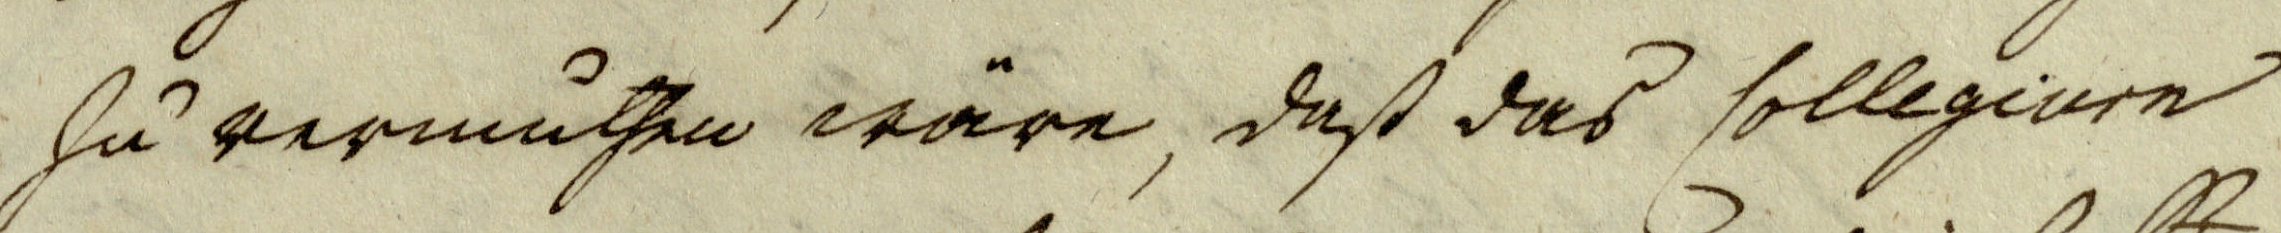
zu vermuthen wäre, daß das Collegium
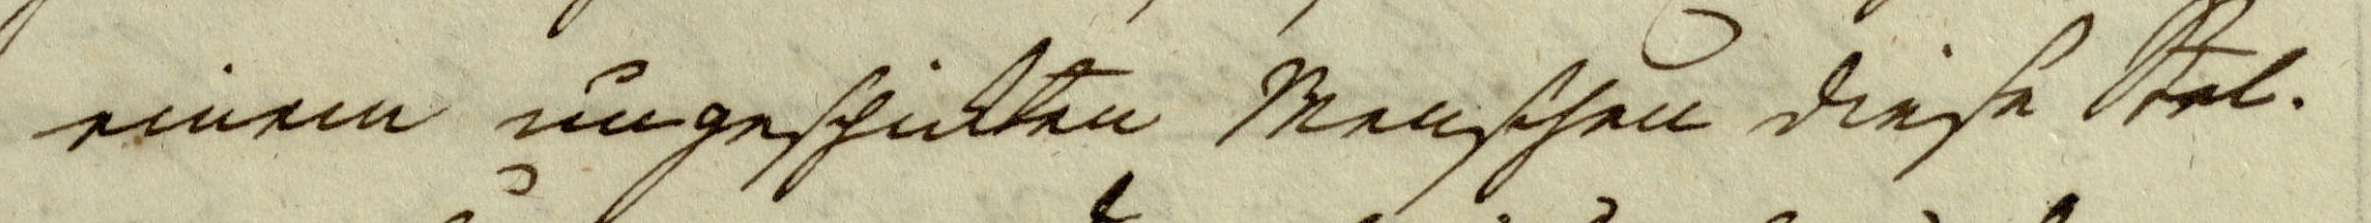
einem ungeschulten Menschen diese Stel¬
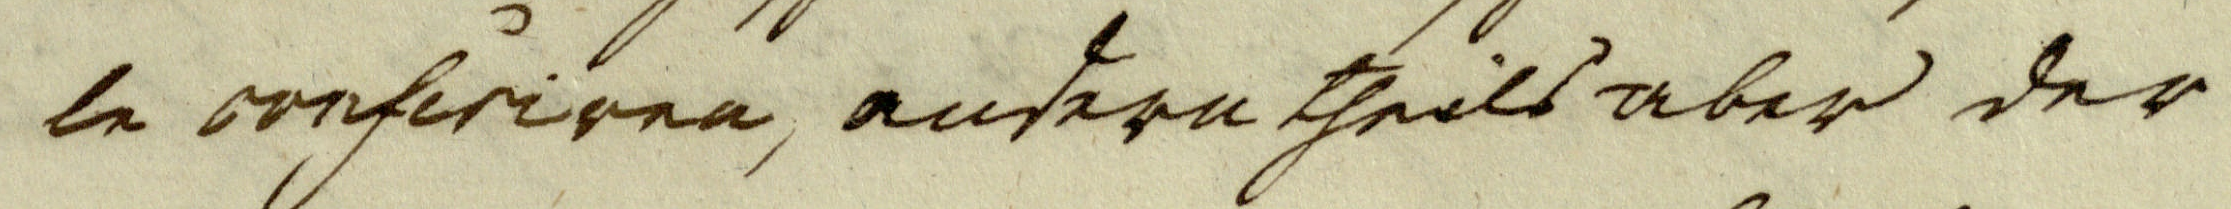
le conferiren, andern theils aber der
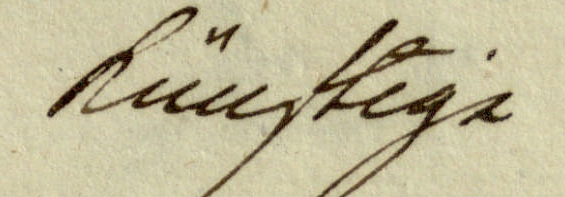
künftige
